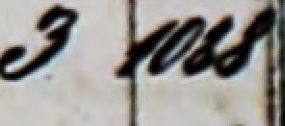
3 1088
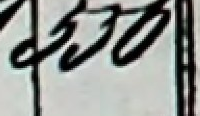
556
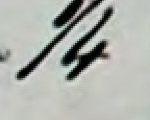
1/4
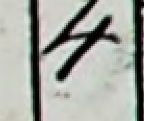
4
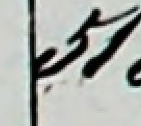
51
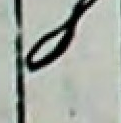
8
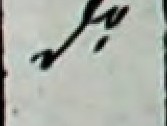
Do
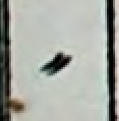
„
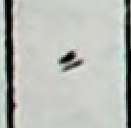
„
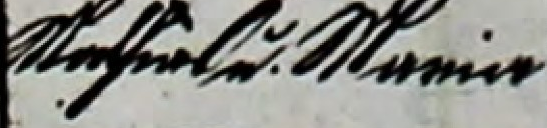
Mathias u. Maria
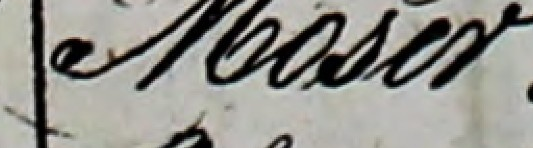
Moser
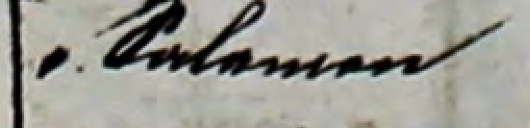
v. Salemen
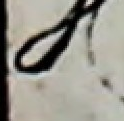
8
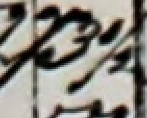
73 1/2
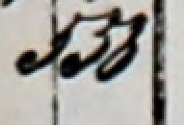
538
